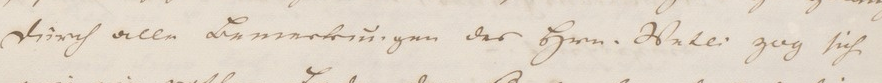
Durch alle Bemerkungen des Hrn. Wetli zog sich
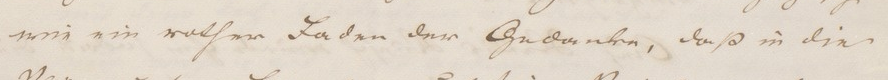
wie ein rother Faden der Gedanke, daß in die
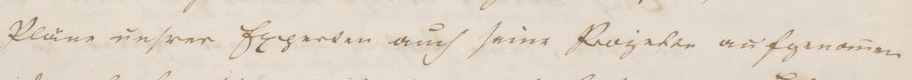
Pläne unsrer Experten auch seine Projekte aufgenommen
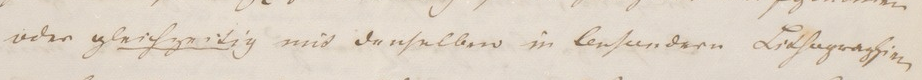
oder gleichzeitig mit denselben in besondern Lithographien
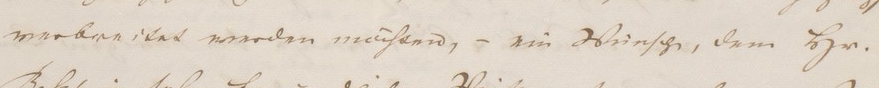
verbreitet werden möchten, – ein Wunsch, dem Hr.
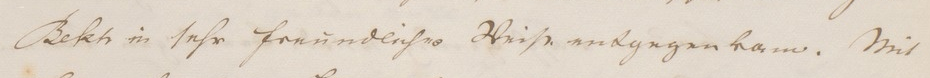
Bekh in sehr freundlicher Weise entgegen kam. Mit
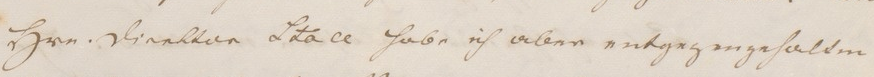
Hrn. Direktor Stoll habe ich aber entgegengehalten,
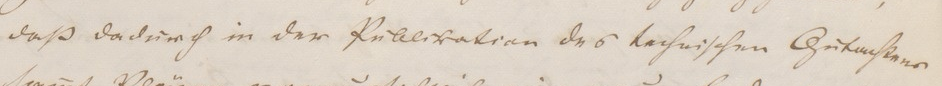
daß dadurch in der Publikation des technischen Gutachtens
